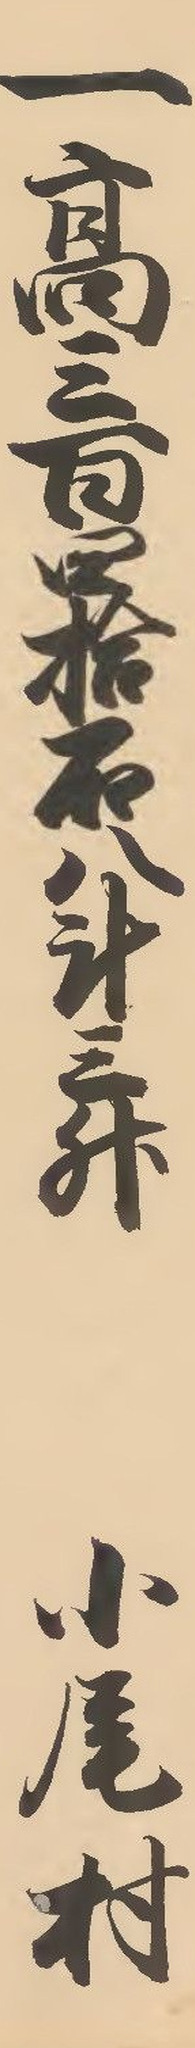一高三百四拾石八斗三升小尾村
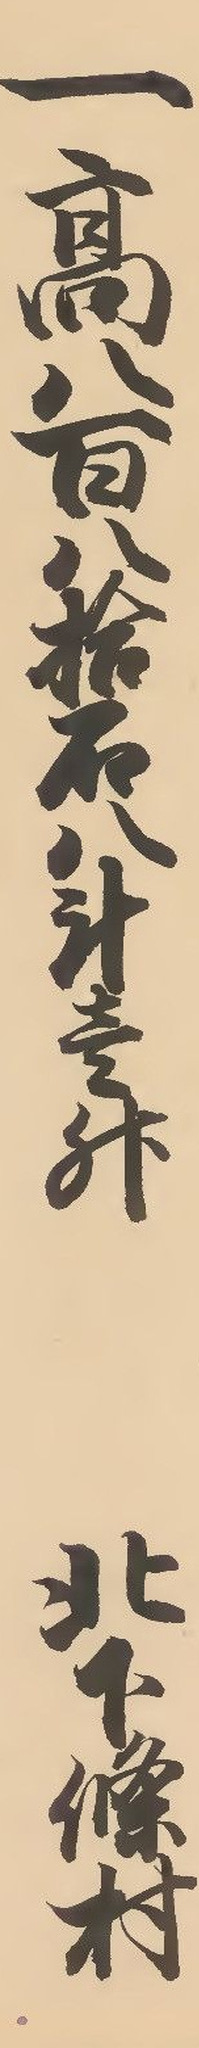一高八百八拾石八斗壱升北下条村
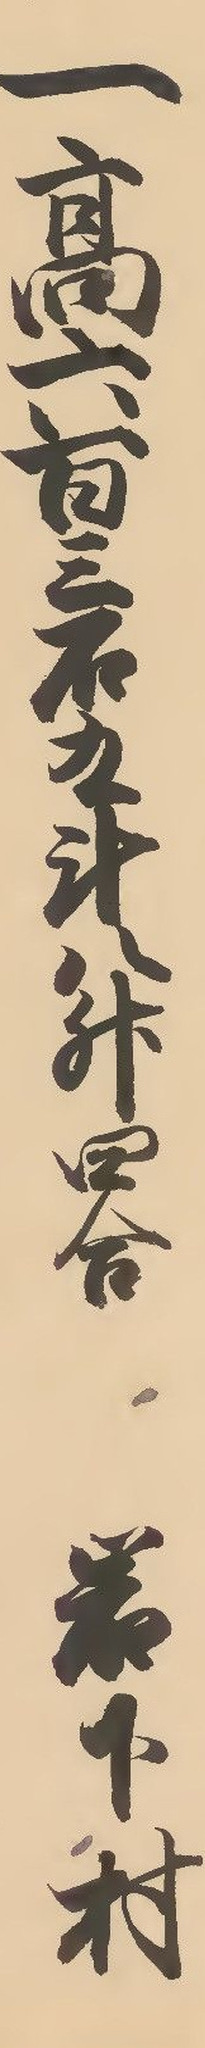一高六百三石九斗八升四合岩下村

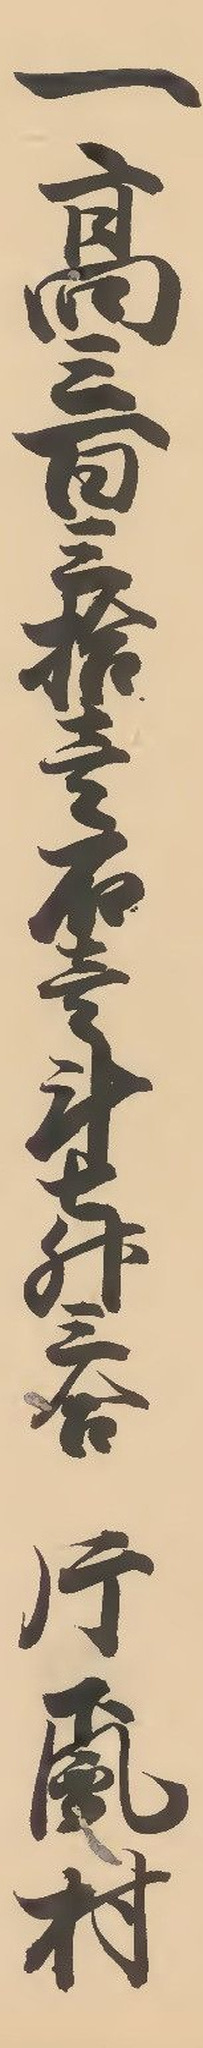一高三百三拾壱石壱斗七升三合片颪村
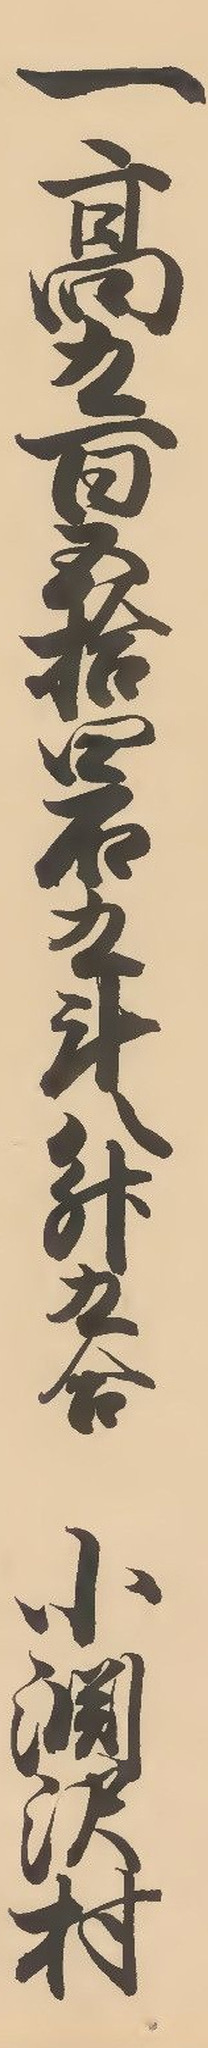一高九百五拾四石九斗八升九合小淵沢村
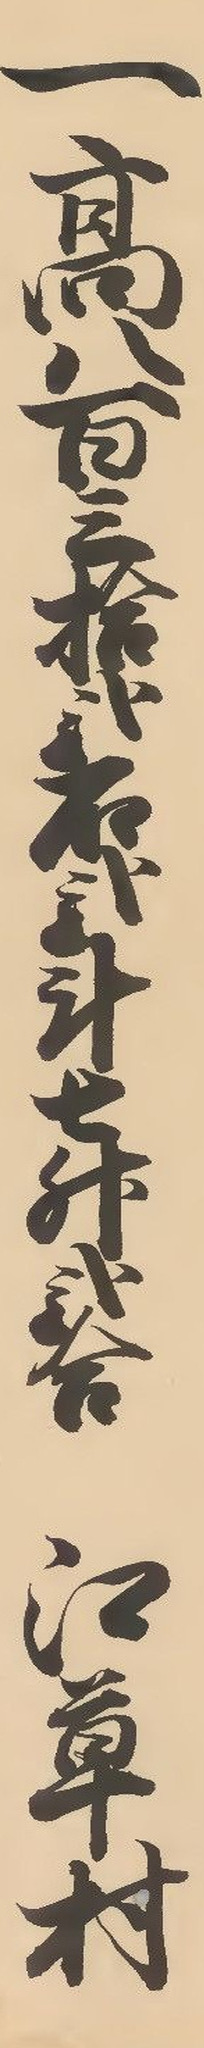一高八百三拾弐石弐斗七升弐合江草村
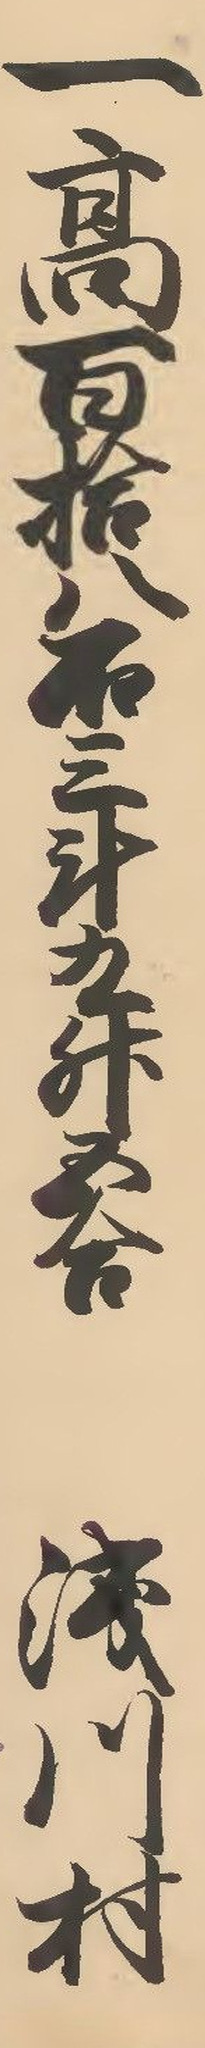一高百拾八石三斗九升五合浅川村
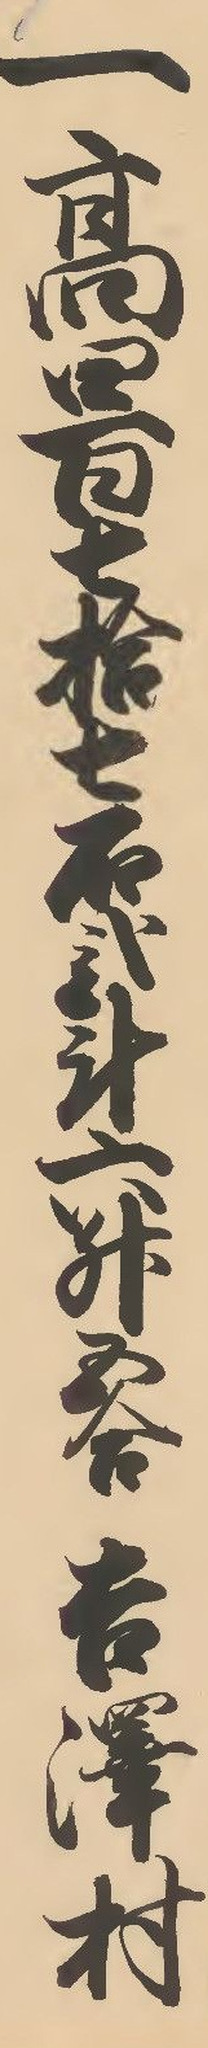一高四百七拾七石弐斗六升五合吉沢村
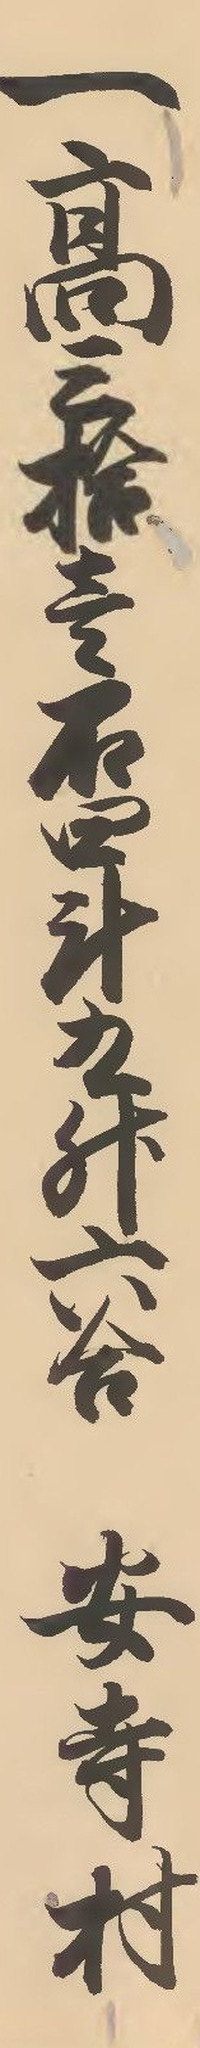一高三拾壱石四斗九升六合安寺村
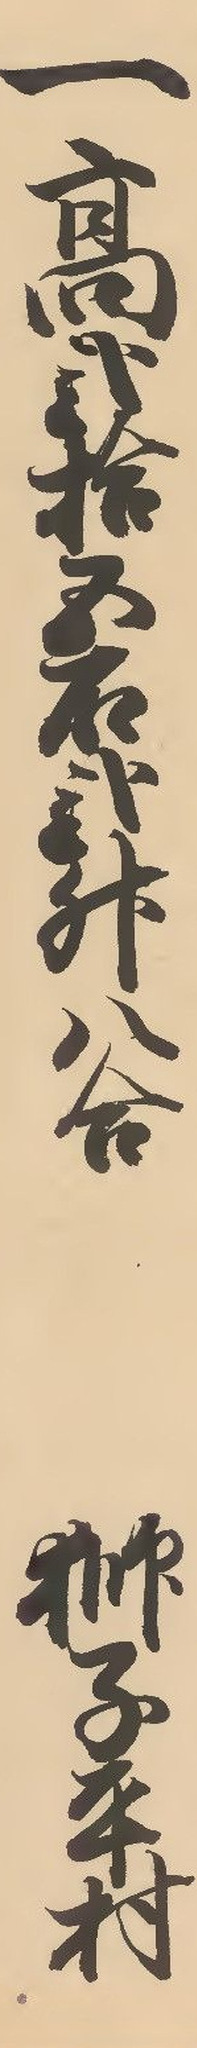一高弐拾五石弐升八合獅子平村
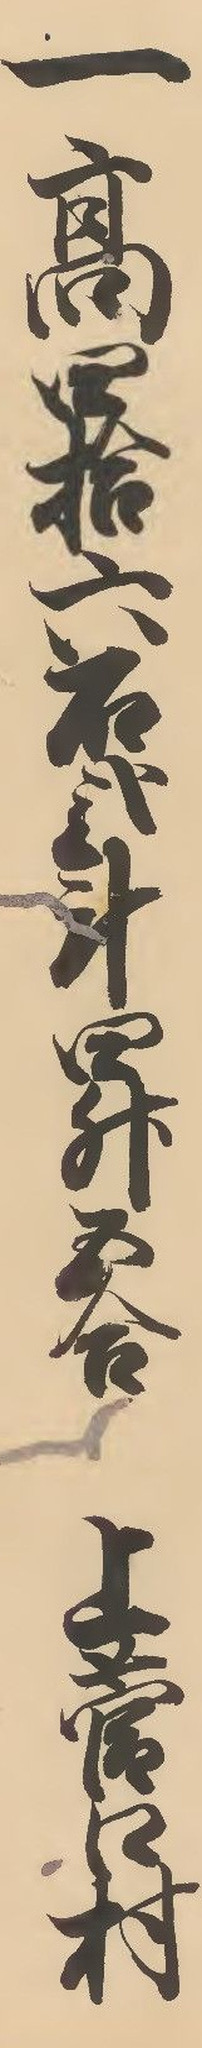一高四拾六石弐斗四升五合上菅口村

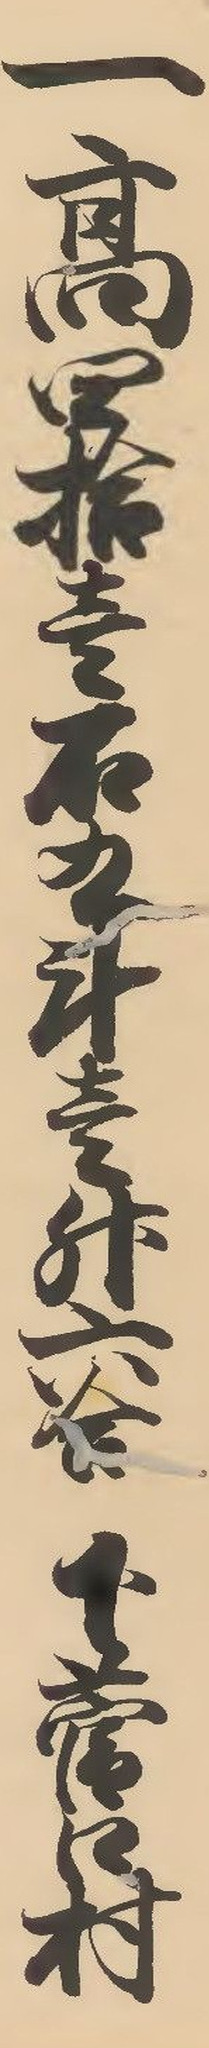一高四拾壱石九斗壱升六合下菅口村
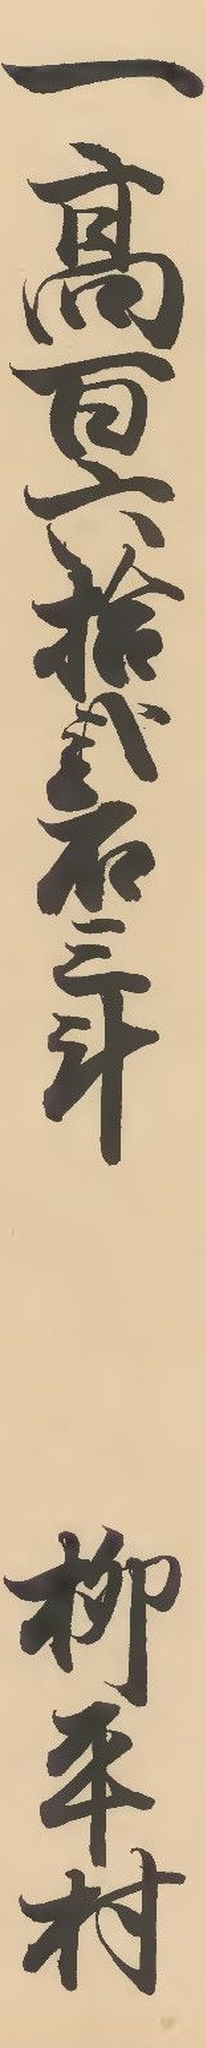一高百六拾弐石三斗柳平村
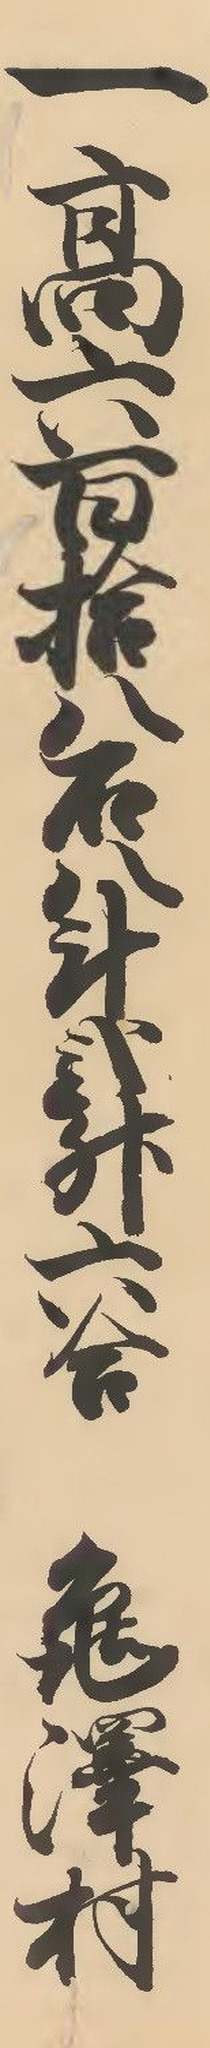一高六百拾八石八斗弐升六合亀沢村
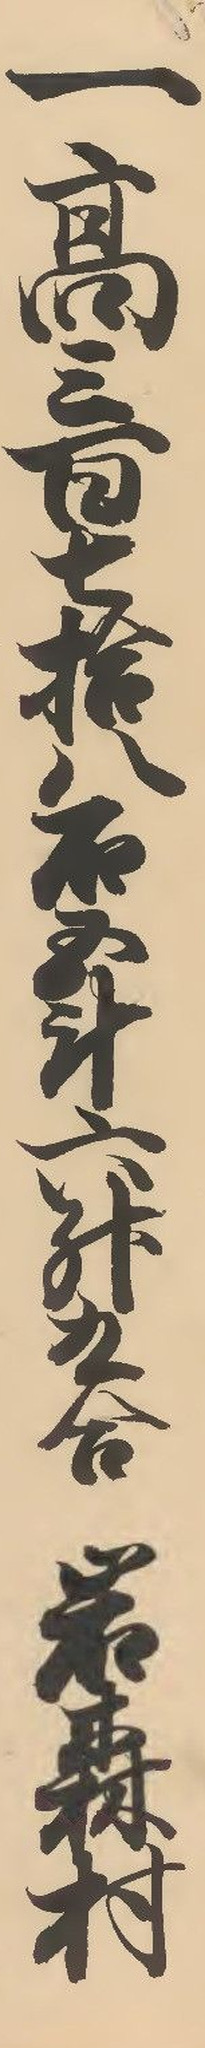一高三百七拾八石五斗六升九合岩森村
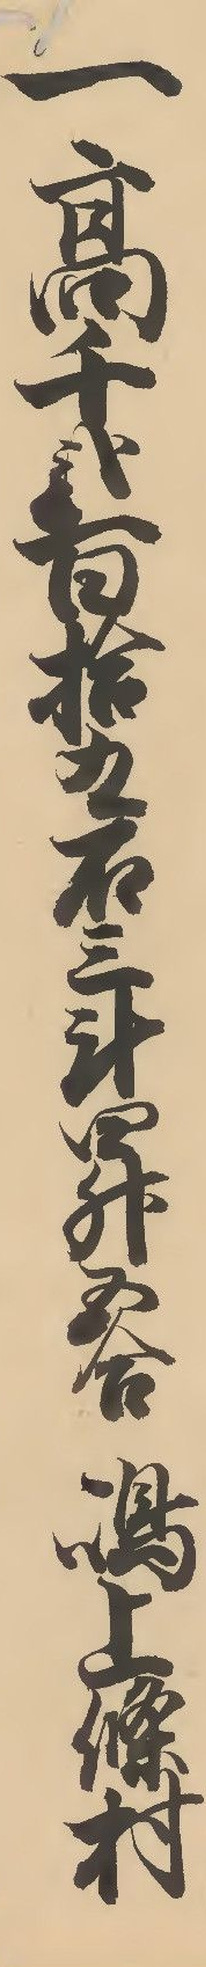一高千弐百拾九石三斗四升五合島上条村
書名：甲斐国郷帳
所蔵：国立公文書館 National Archives of Japan
